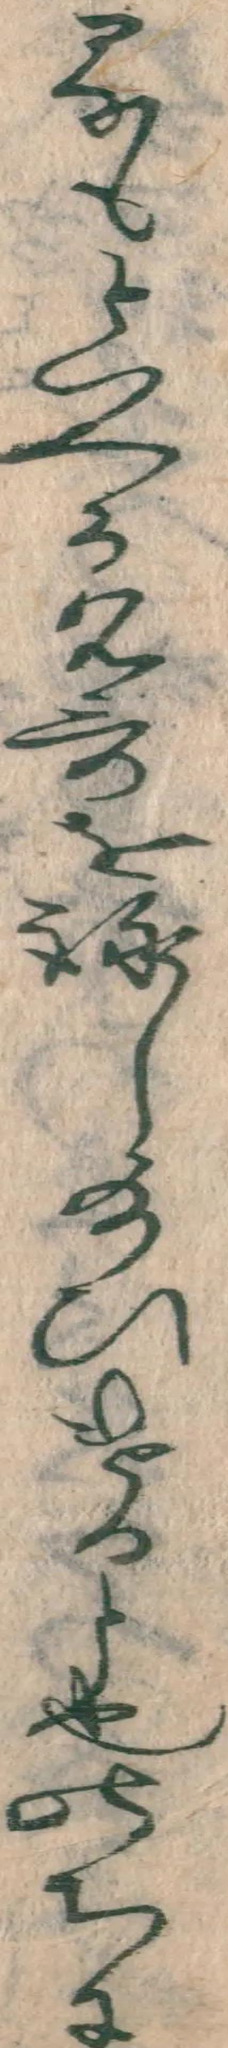るもといへる名哥を詠し給ひけると也のちに
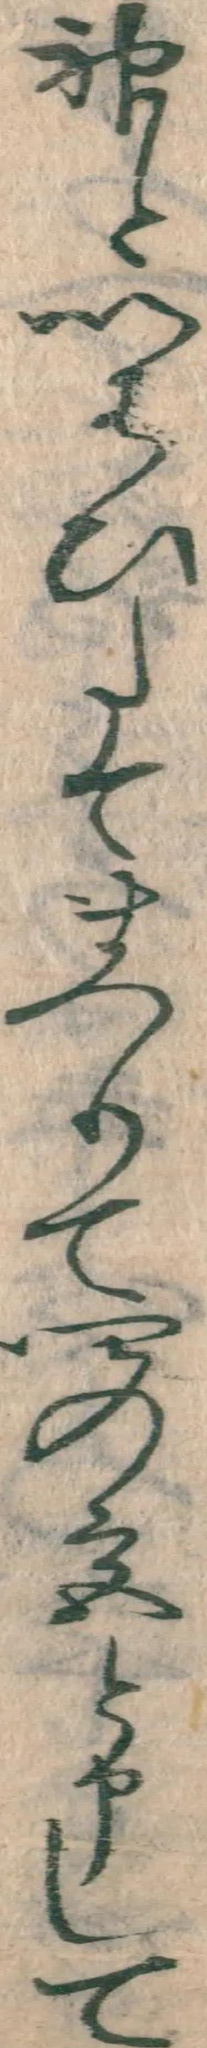神といはひたてまつりて四の宮と申して
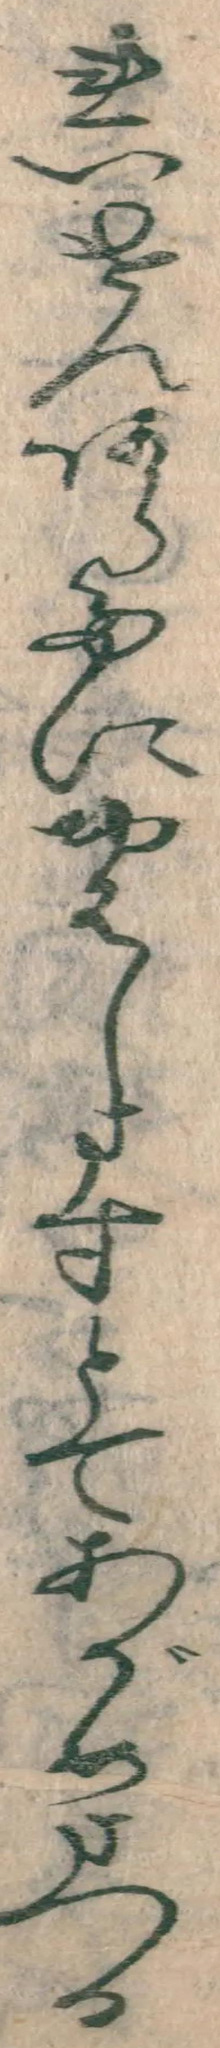れいけんあらたにおはしますとてあがめまつる
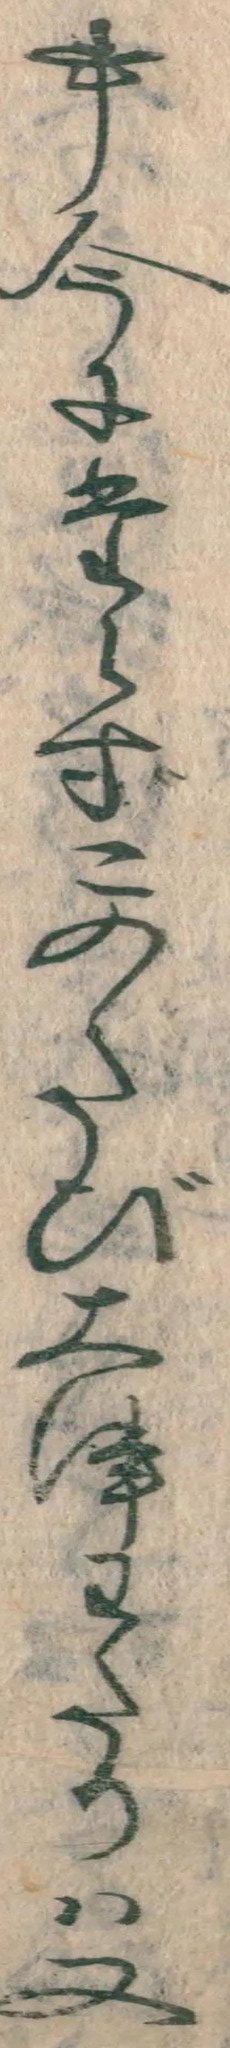事今にたえずこのたび大津わたりは又
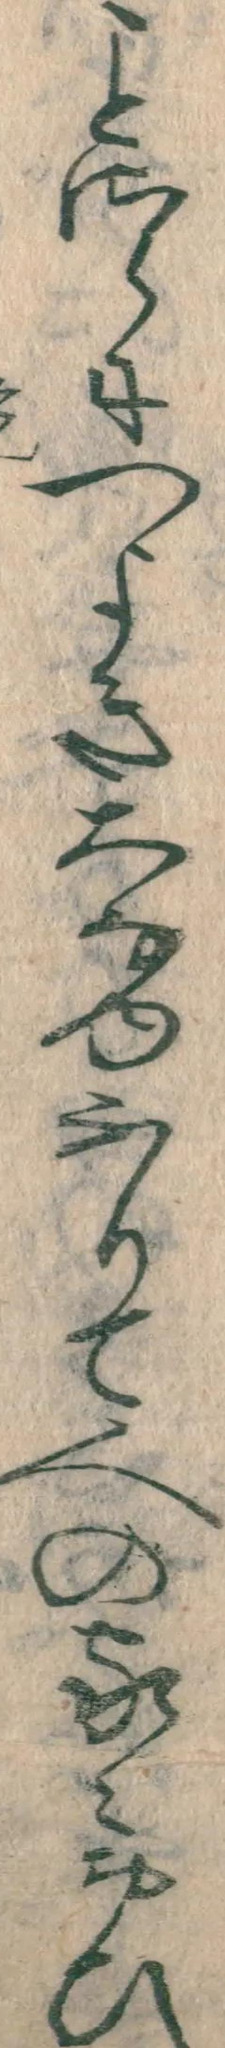ことさらにつよき大なゆふりて人の家におひ
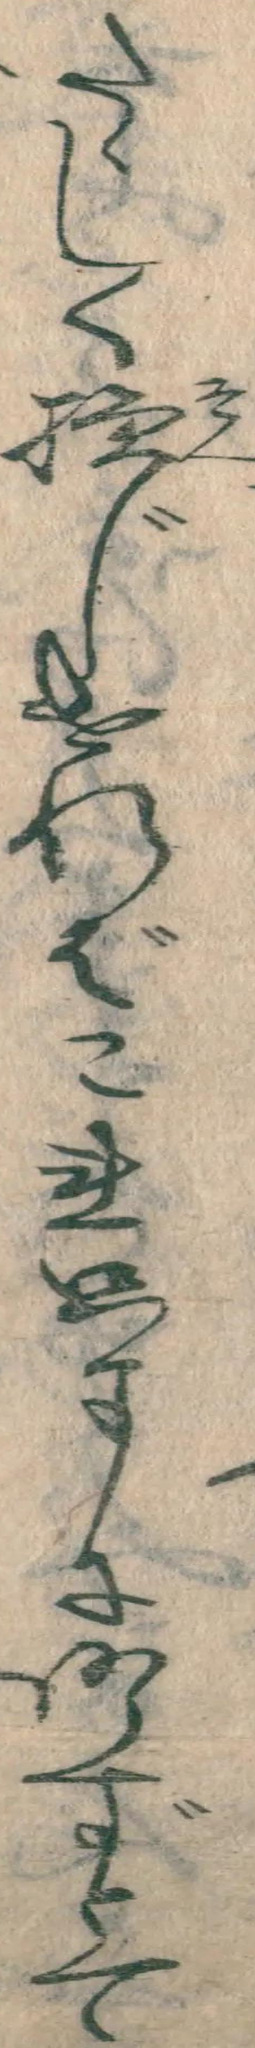たゝしく損じければこれ思事にあらずとて
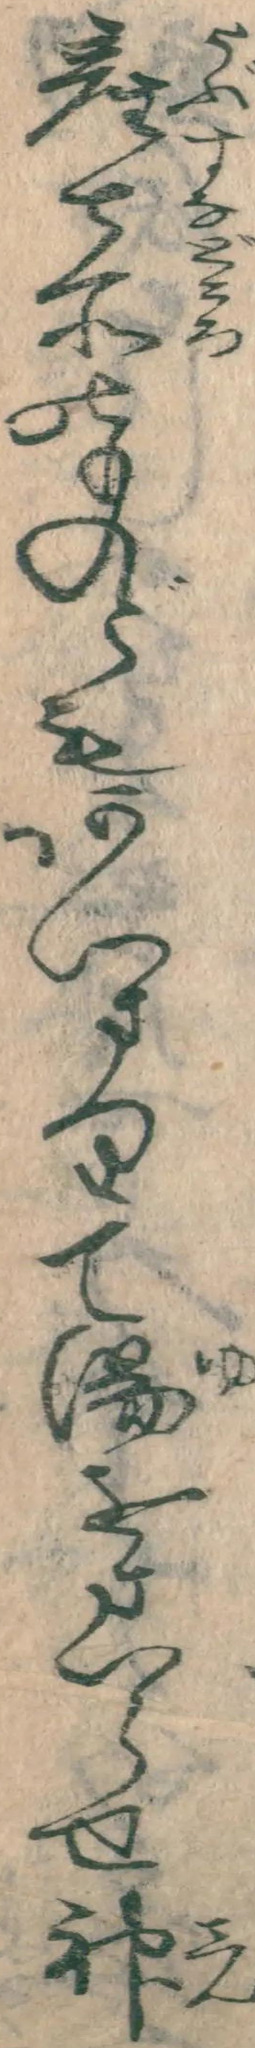産土所のものどもあつまりて湯をまいらせ神

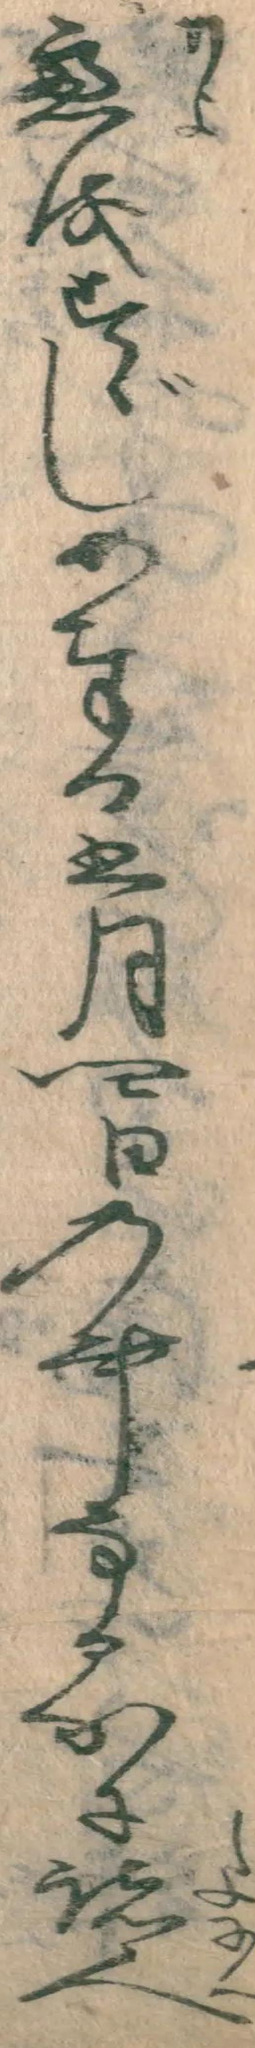慮をすゞしめ奉る五月四日の事なるに諸人
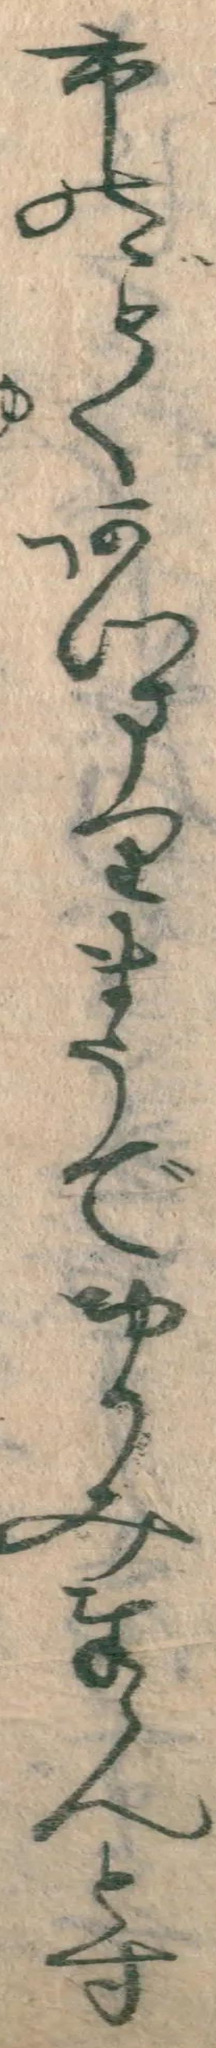市のごとくあつまりまうでおかみ奉らんとす
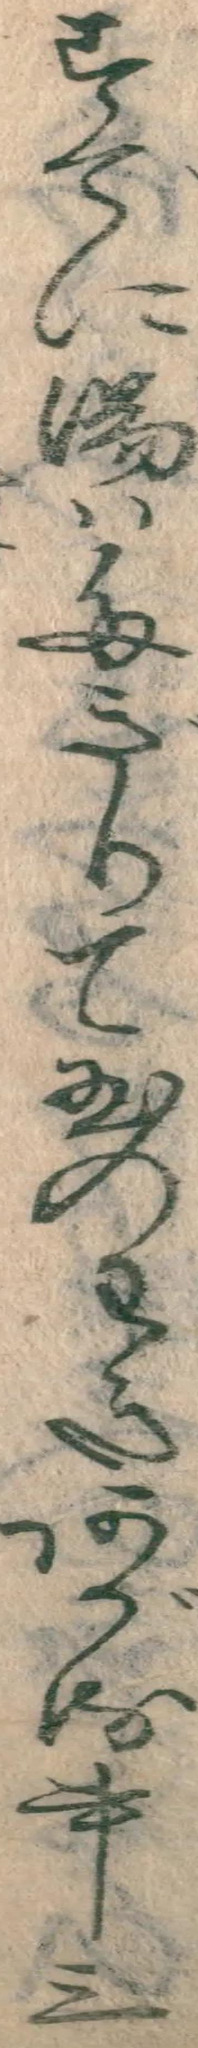すでに湯はたぎりて玉のわきあがる事三
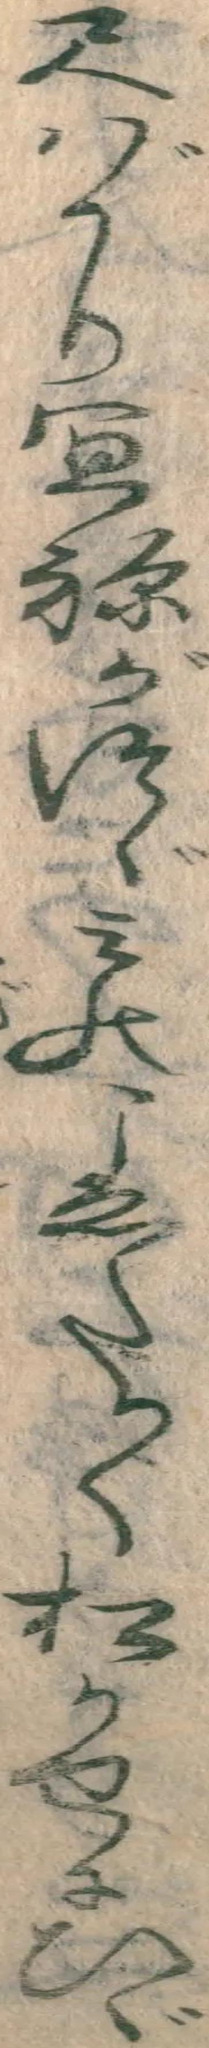尺ばかり宜祢がつゞみのこゑたかく松かせにひゞ
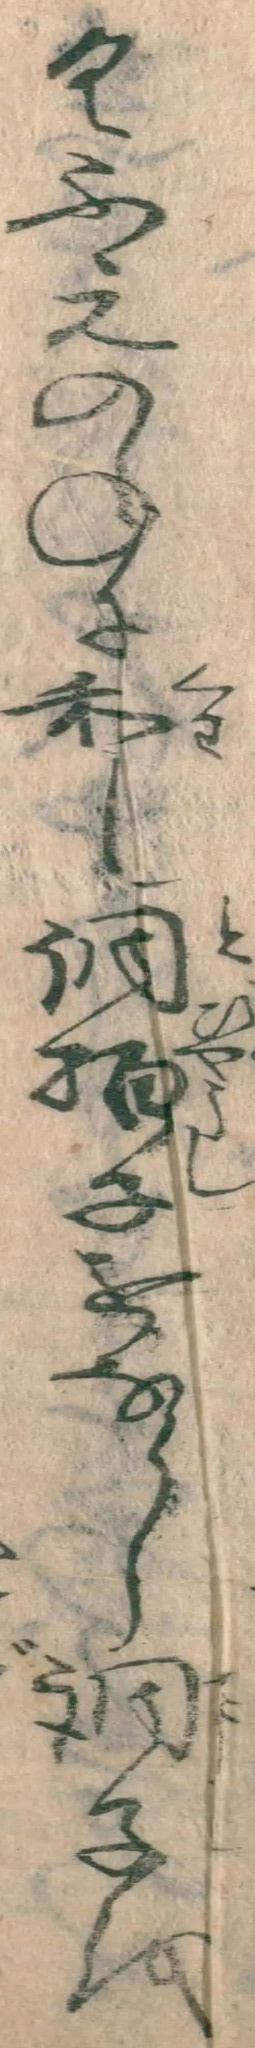くふえのねに禾し銅拍子をならし調子を
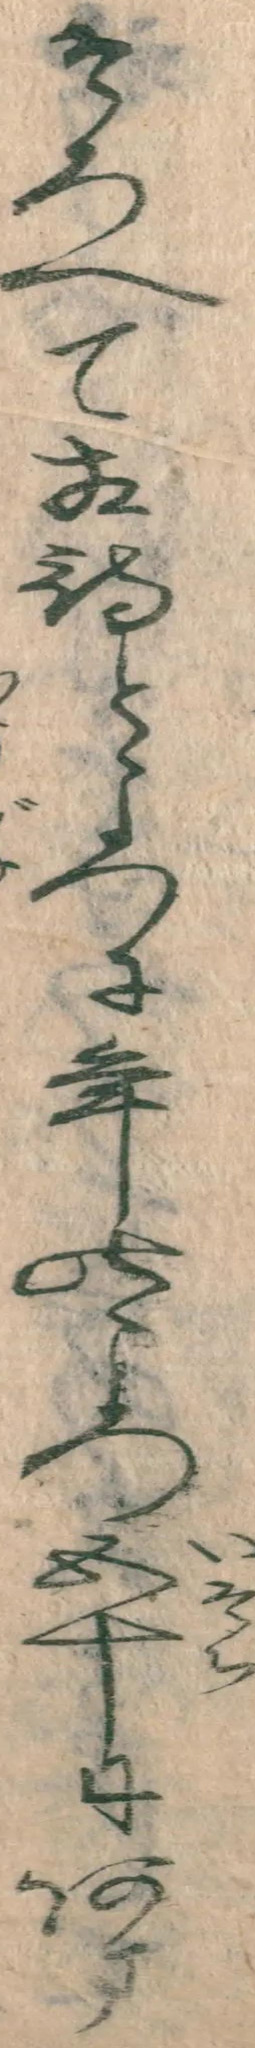そろへて相待ところに年のころ五十にあま
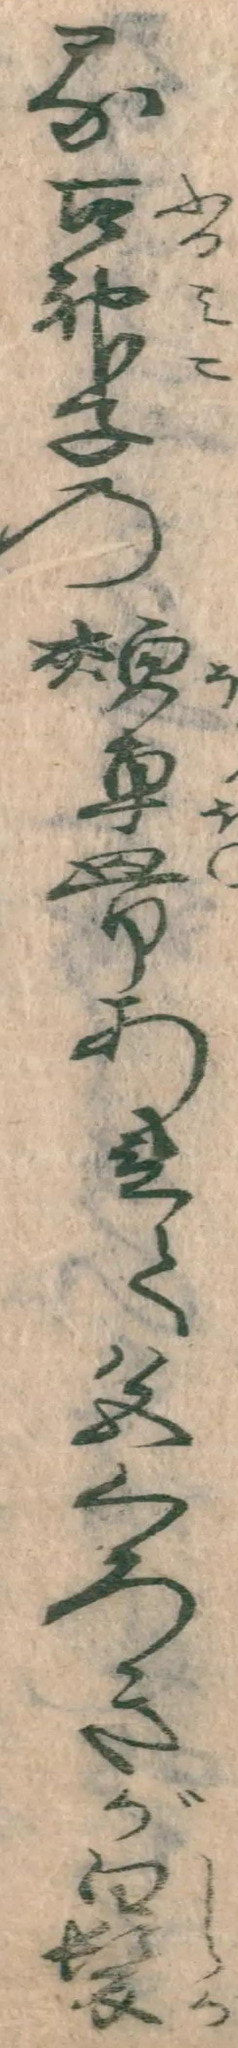る古神子の頬車骨あれて色くろきが白髪
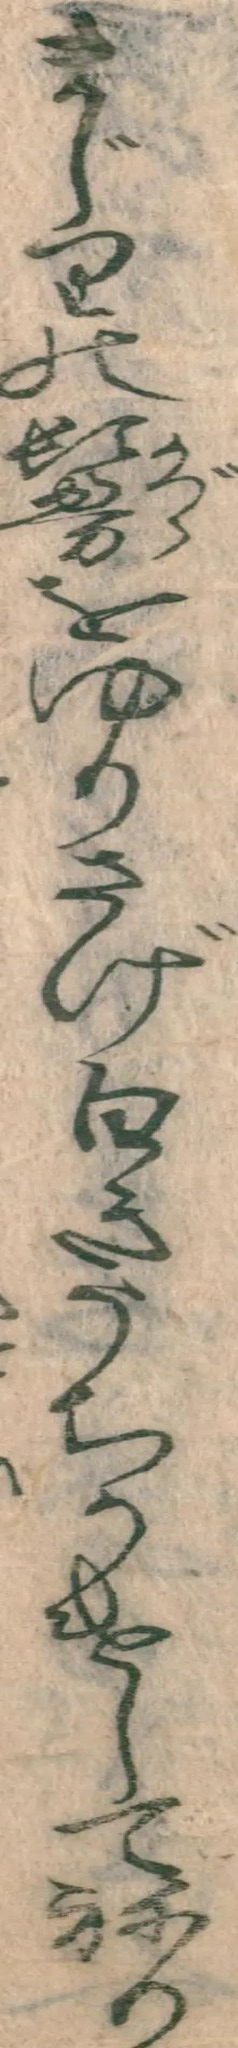まじりの鬘をゆりさげ白きうちかけしてねり
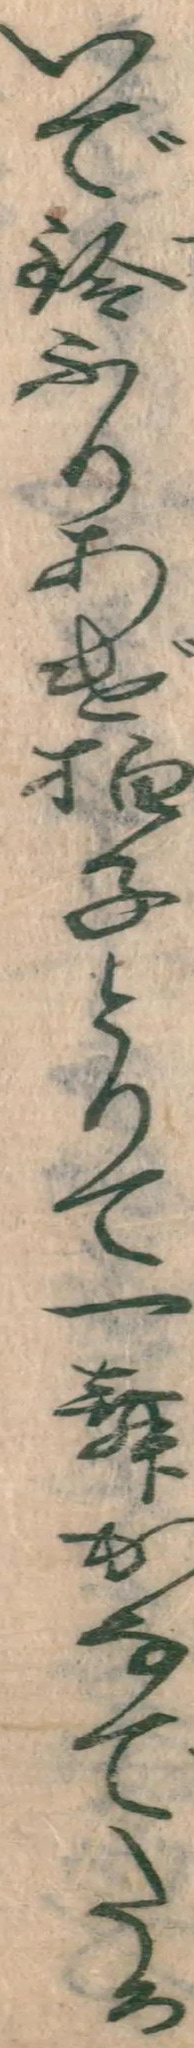いで鈴ふりあげ拍子とりて一舞かなてたる
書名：艱難目異志. 上,下
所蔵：国立国会図書館 National Diet Library, JAPAN
